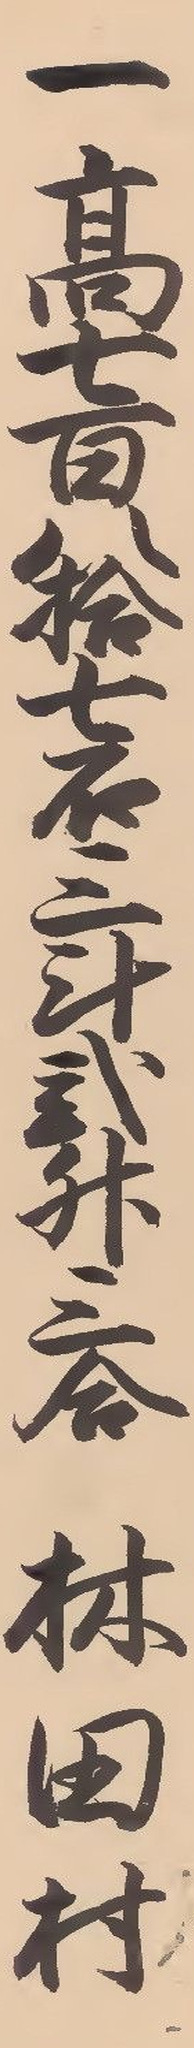一高七百八拾七石三斗弐升三合林田村
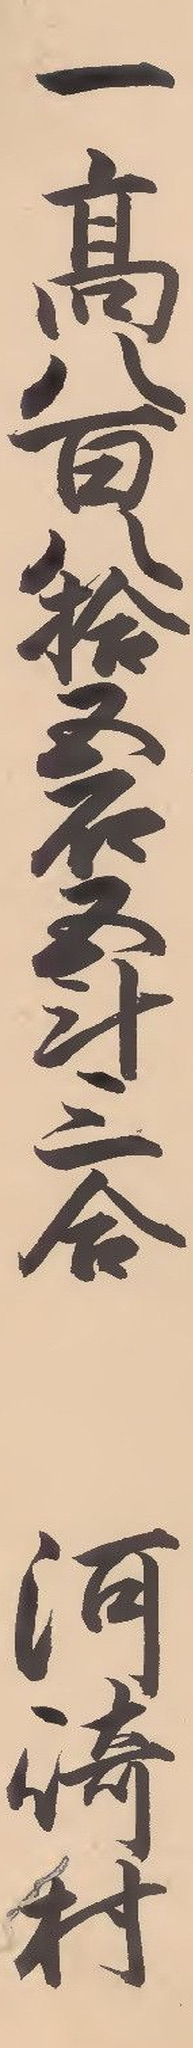一高八百八拾五石五斗三合河崎村

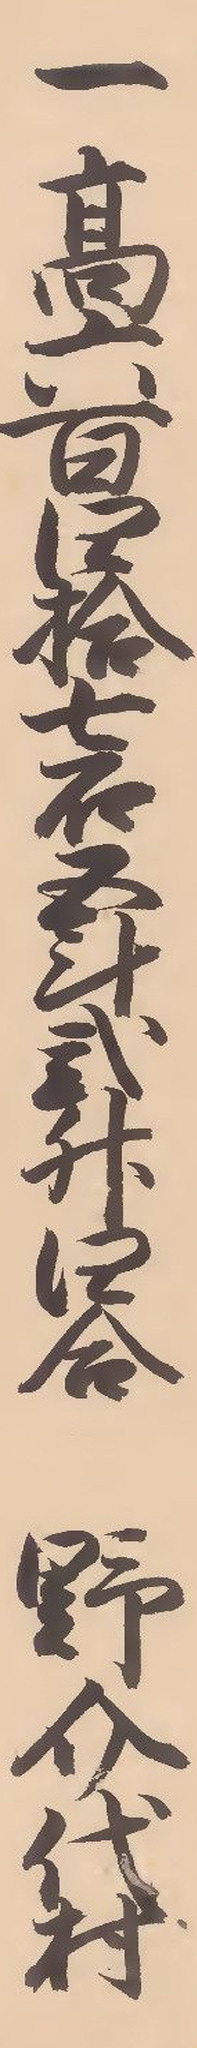一高六百四拾七石五斗弐升四合野介代村
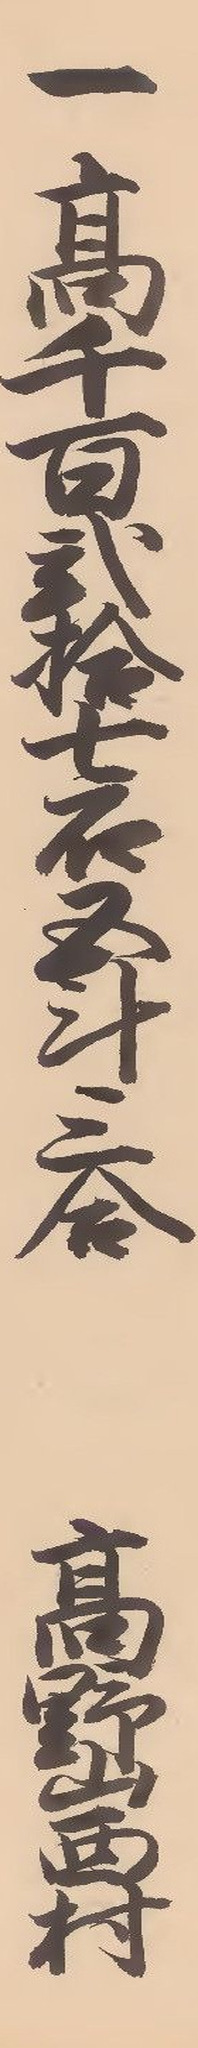一高千百弐拾七石五斗三合高野山西村
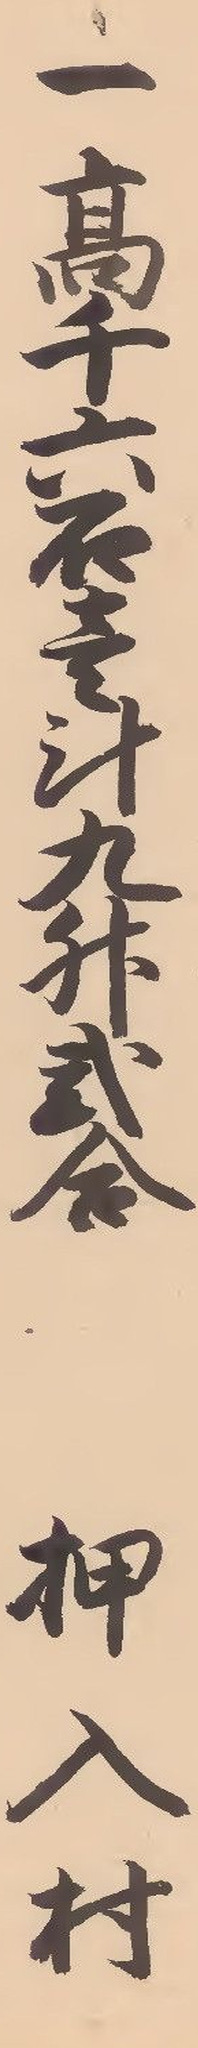一高千六石壱斗九升弐合押入村
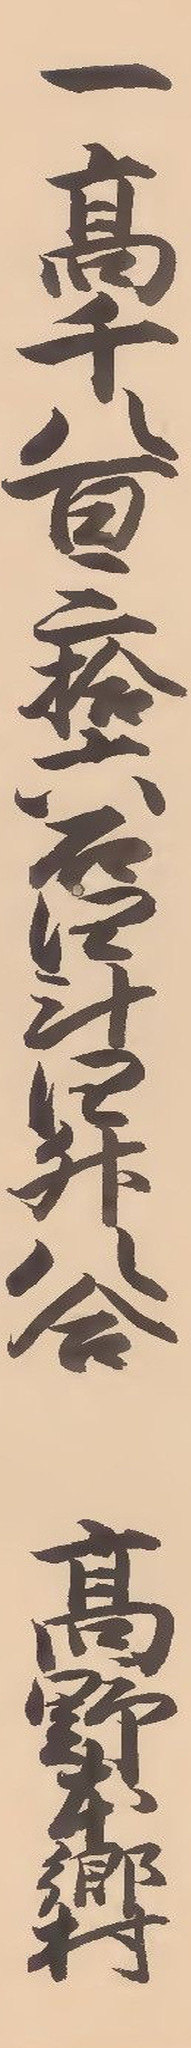一高千八百三拾六石四斗四升八合高野本郷村
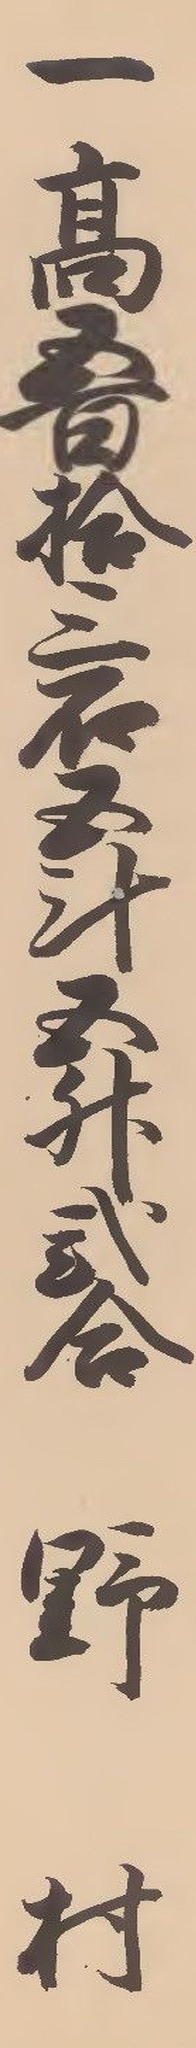一高五百拾三石五斗五升弐合野村
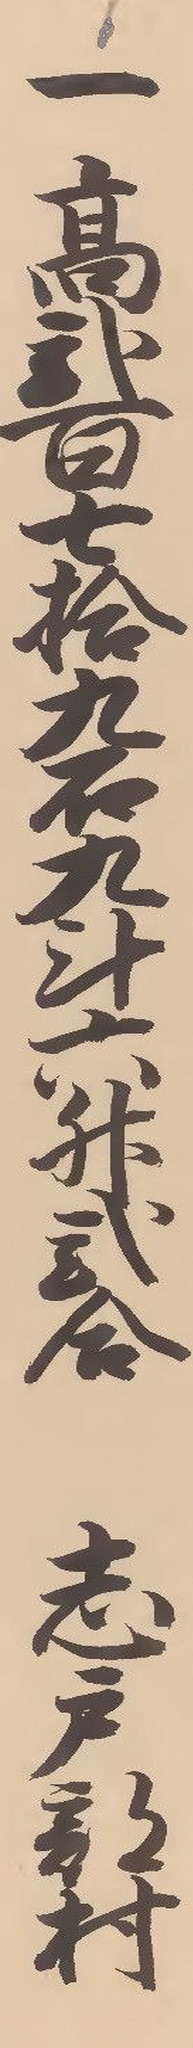一高弐百七拾九石九斗六升弐合志戸部村
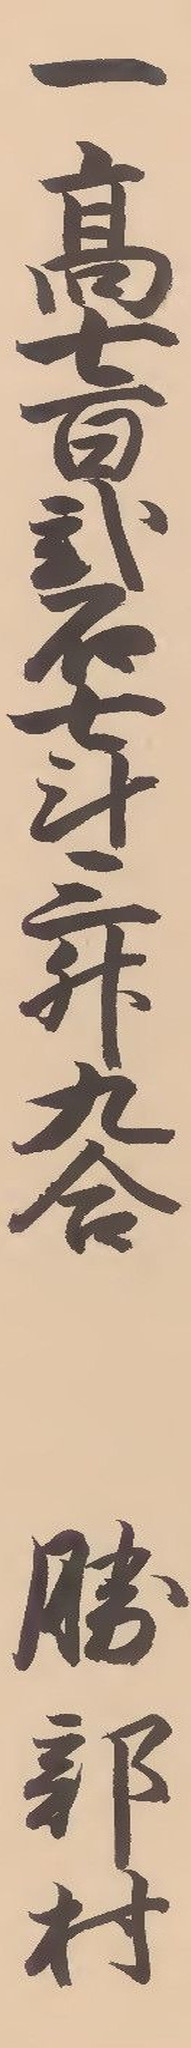一高七百弐石七斗三升九合勝部村
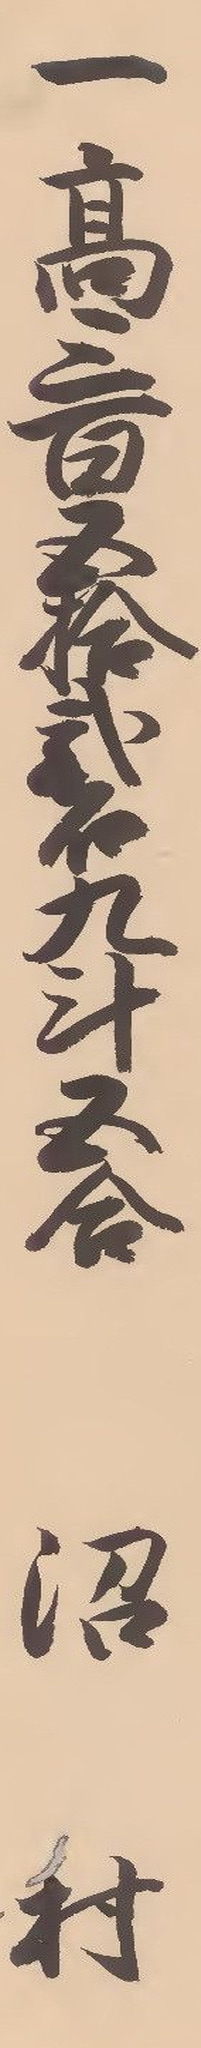一高三百五拾弐石九斗五合沼村

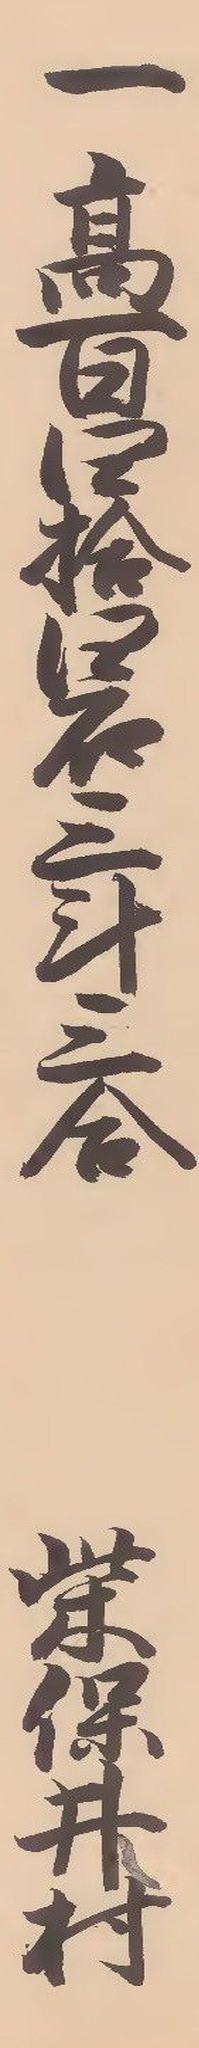一高百四拾四石三斗三合柴保井村
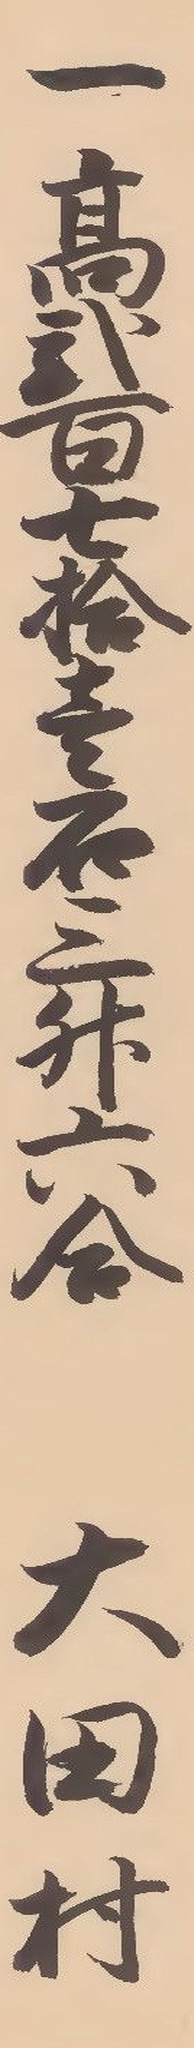一高弐百七拾壱石三升六合大田村
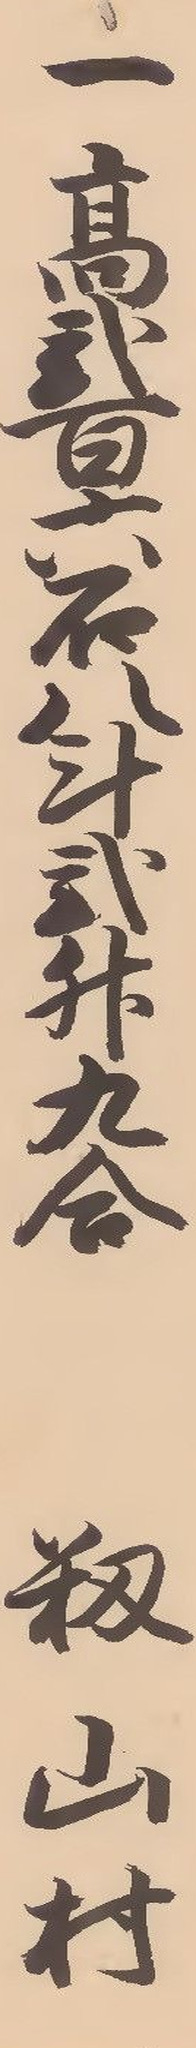一高弐百六石八斗弐升九合籾山村
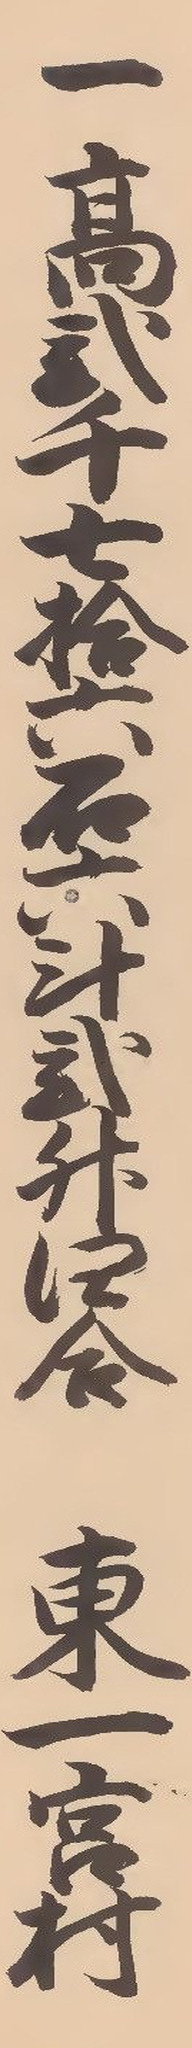一高弐千七拾六石六斗弐升四合東一宮村
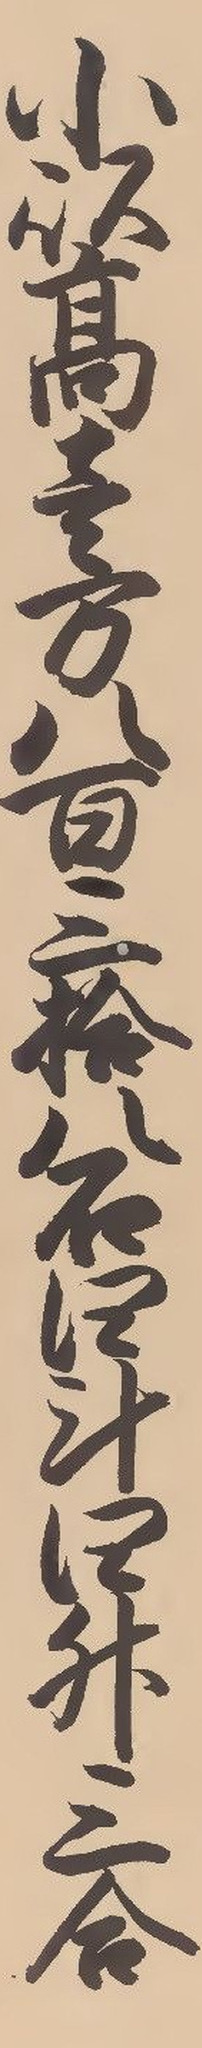小以高壱方八百三拾八石四斗四升三合

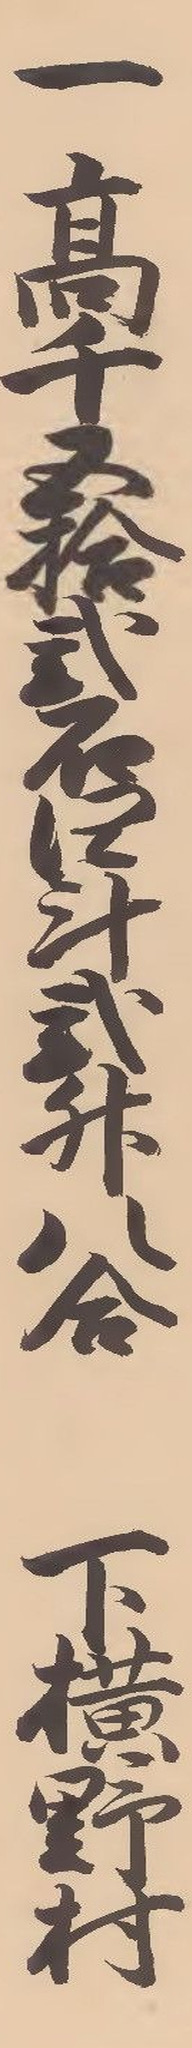一高千五拾弐石四斗弐升八合下横野村
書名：美作国郷帳
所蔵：国立公文書館 National Archives of Japan
